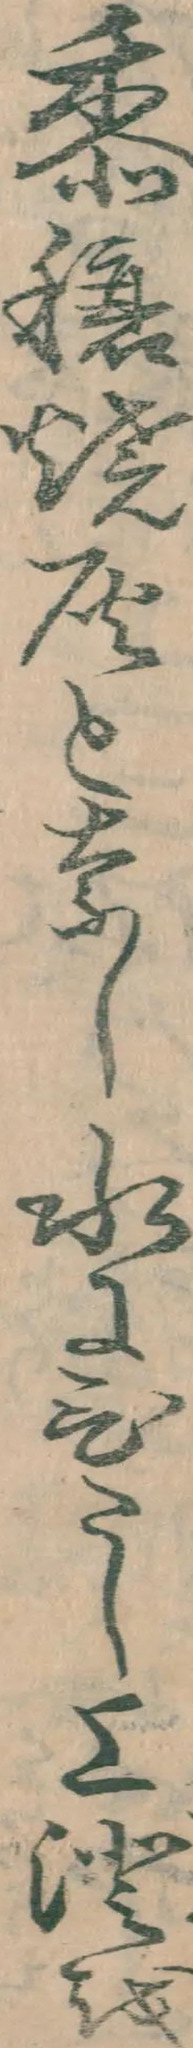黍焼灰となし水にひたし上澄を
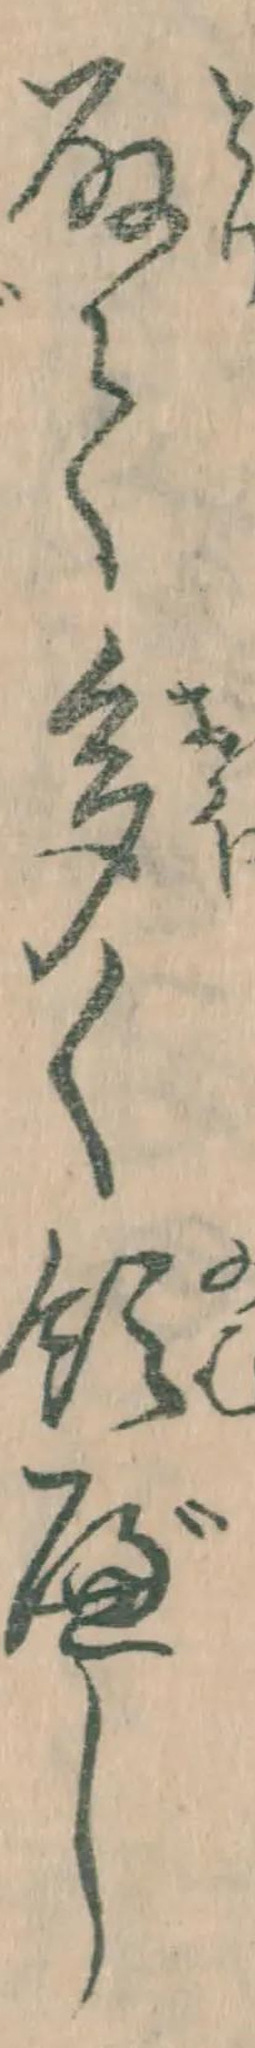取て多く飲べし
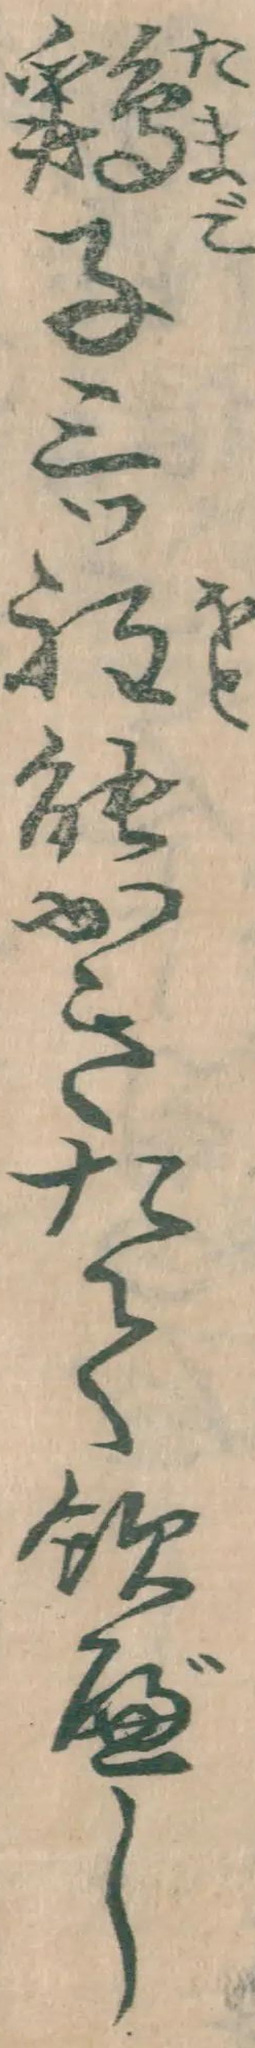鶏子三ッ程能かきたて飲べし
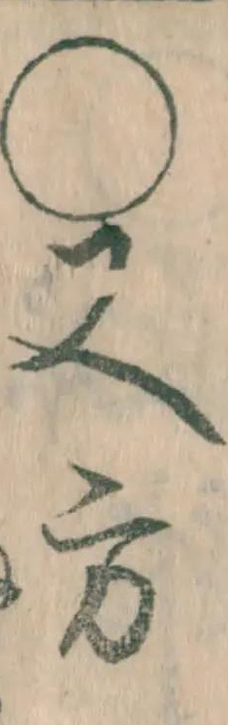〇又方
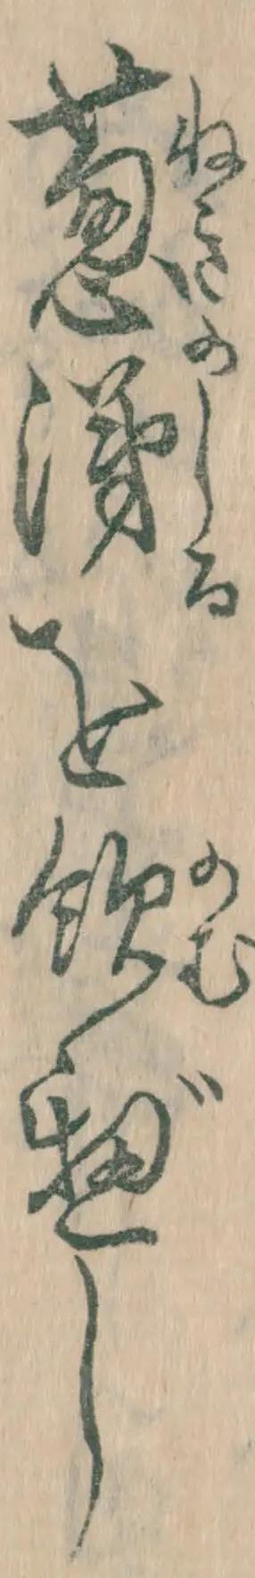葱涕を飲べし
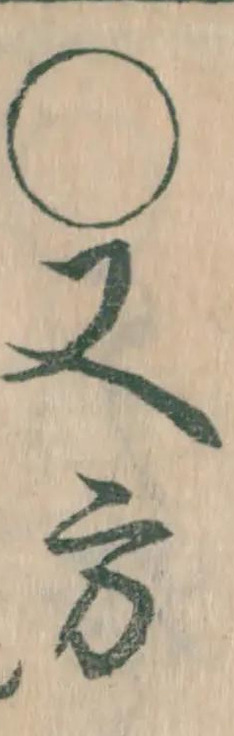〇又方
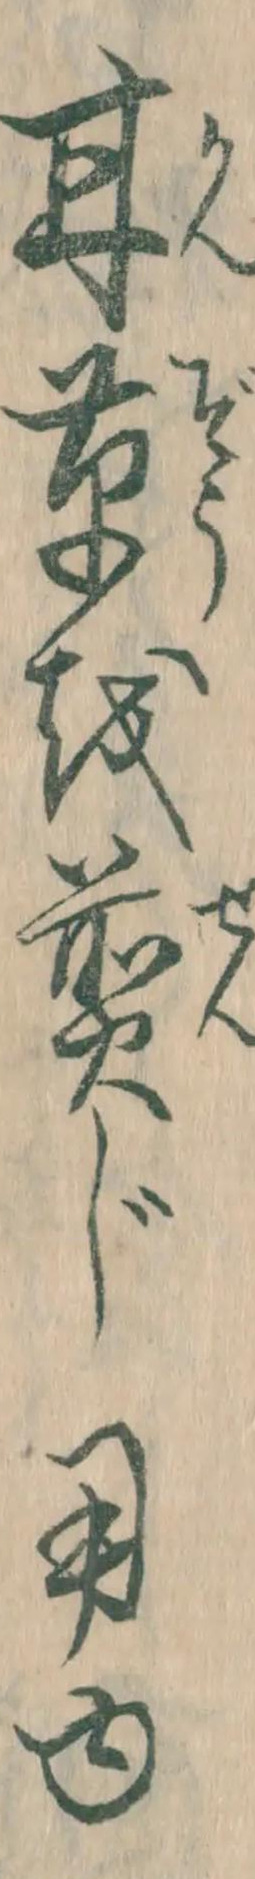甘草を煎じ用ゆ

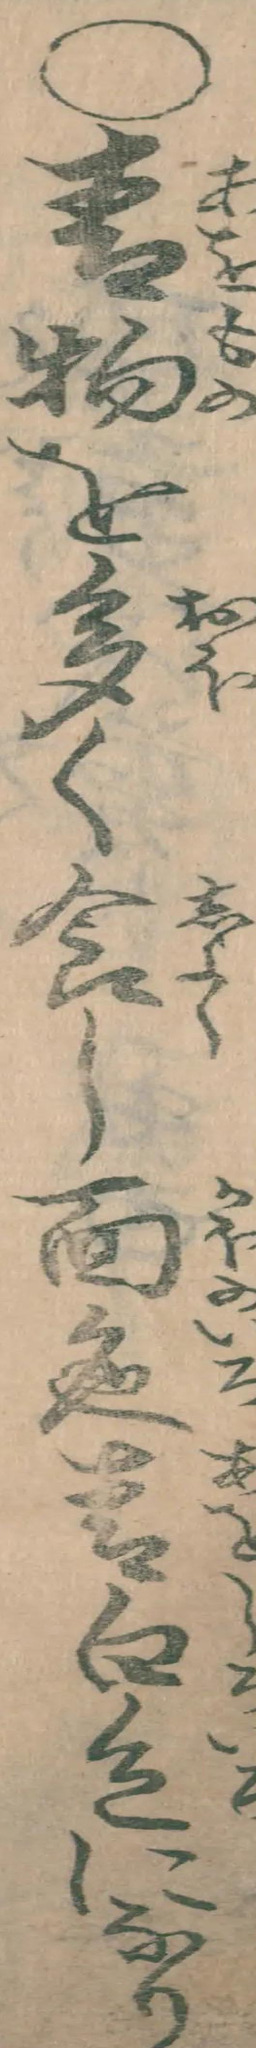〇青物を多く食し面色青白色になり
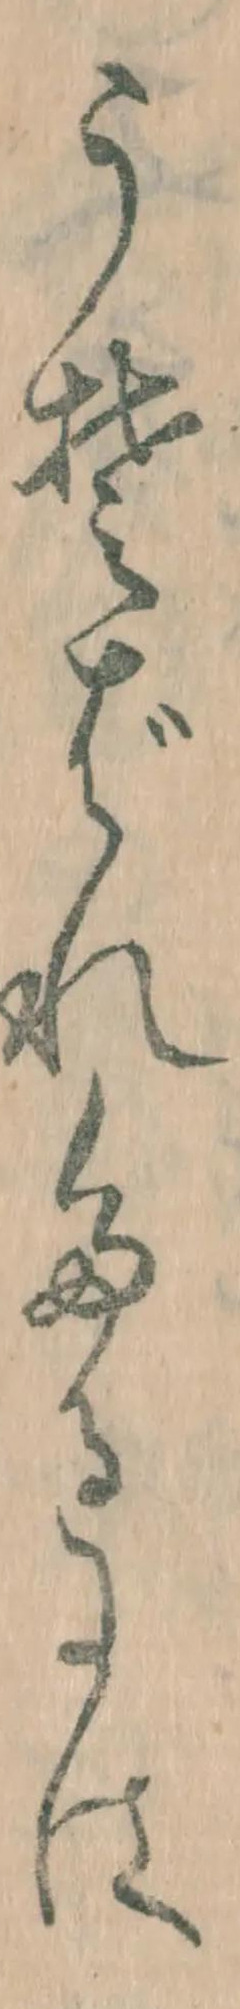うそばれたるには
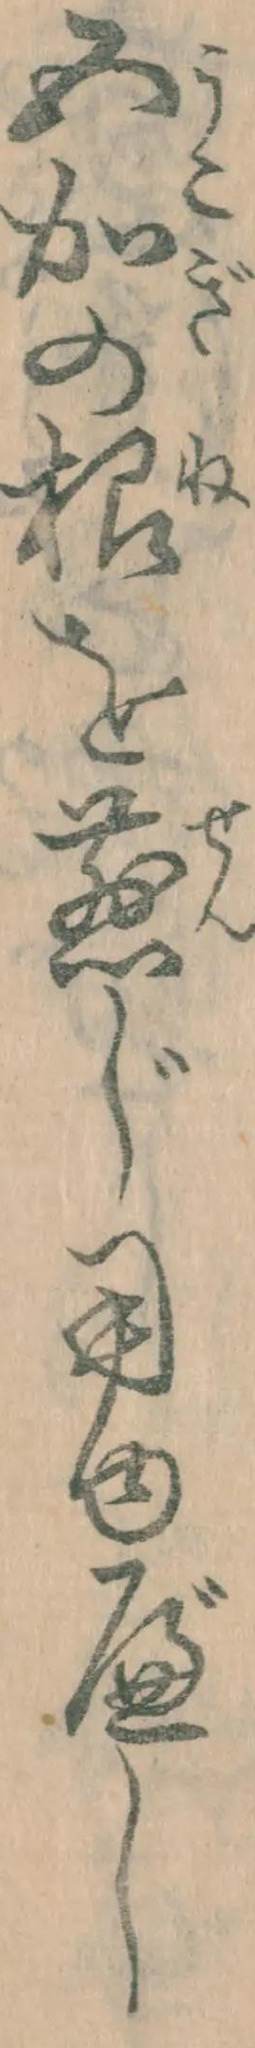五加の根を煎じ用ゆべし
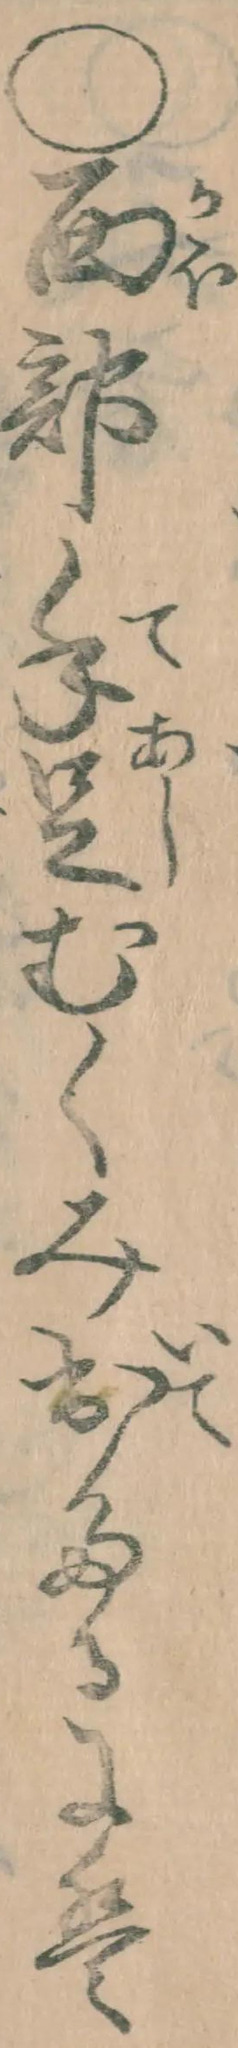〇面部手足むくみ出たるには
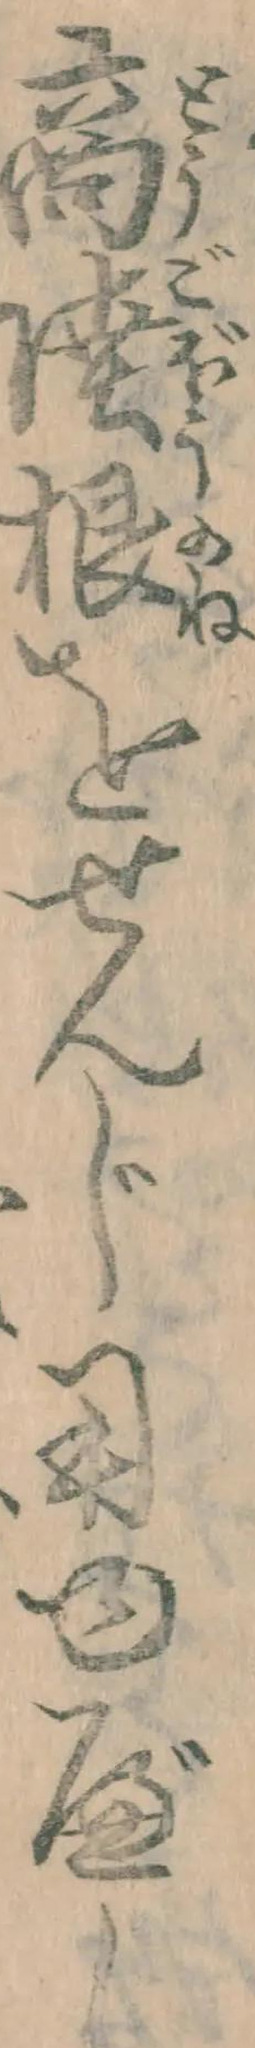商陸根をせんじ用ゆべし
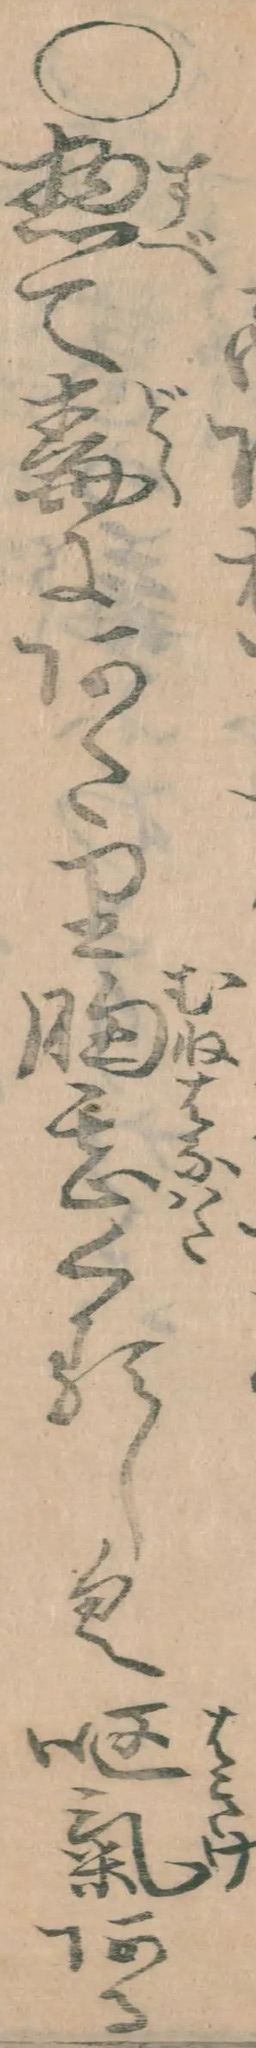〇惣て毒にあたり胸甚くるしく嘔気ある
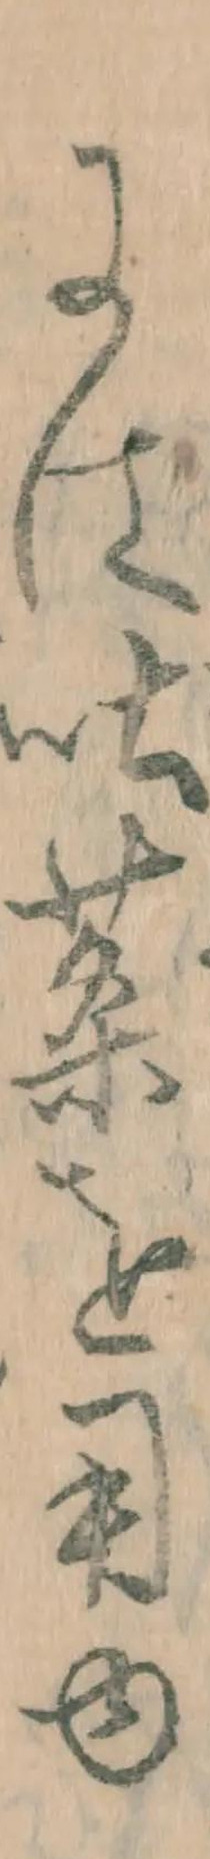には吐薬を用ゆ
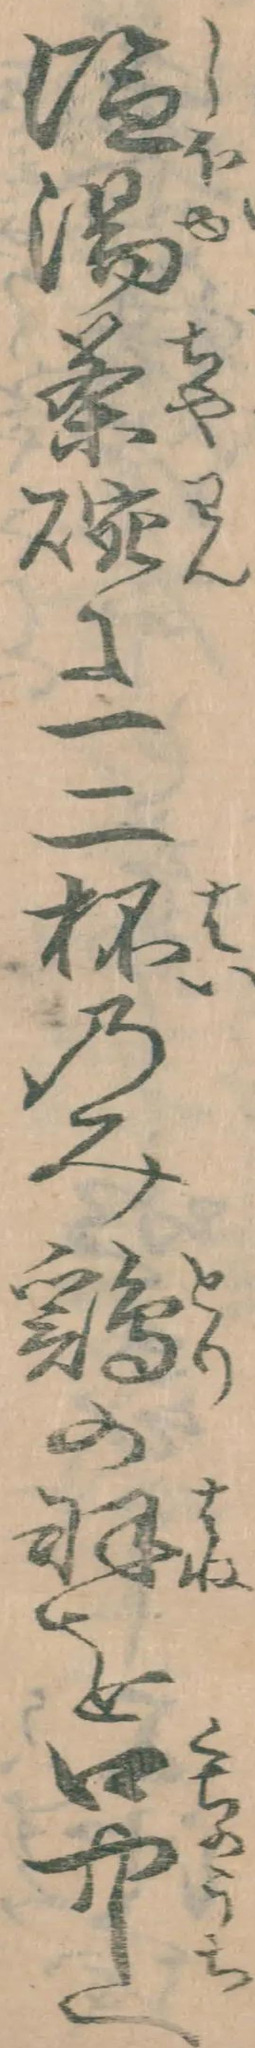塩湯茶碗に一二杯のみ鶏の羽を口中へ
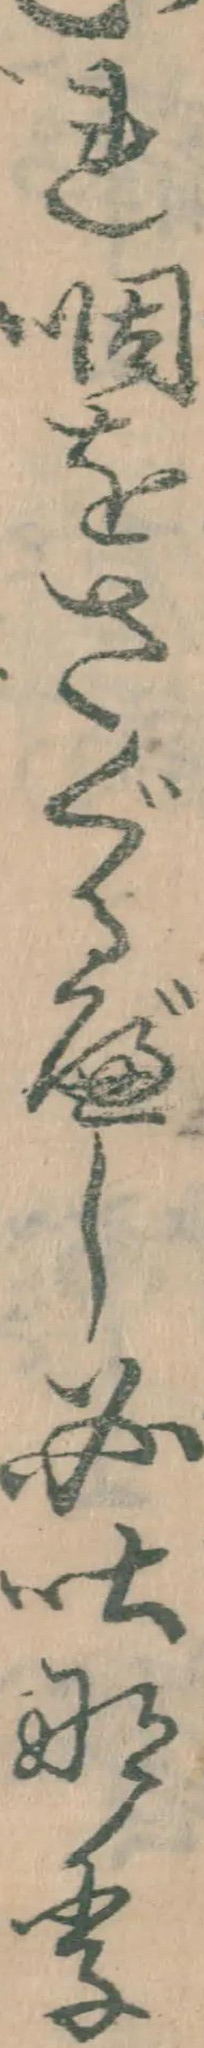いれ咽をさぐるべし必吐なり
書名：救荒鄙諭
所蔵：国立国会図書館 National Diet Library, JAPAN
